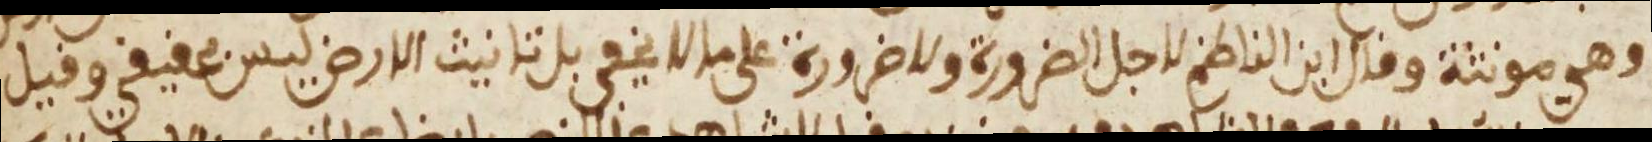و هي مونثة و قال ابن الناظم لاجل الضرورة و لا ضرورة على ما لا يخفى بل تانيث الارض ليس بحقيقي و قيل
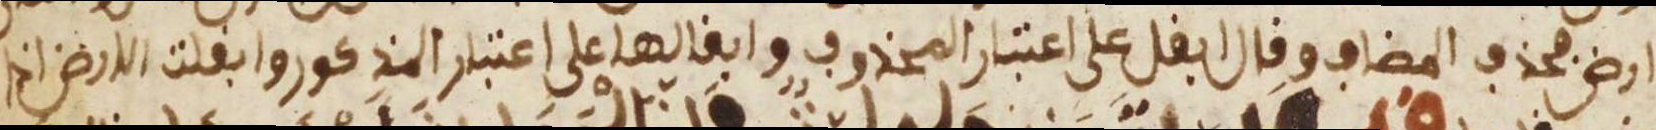ارض فحذف المضاف و قال ابقل على اعتبار المحذوف و ابقالها على اعتبار المذكور و ابقلت الارض اذا
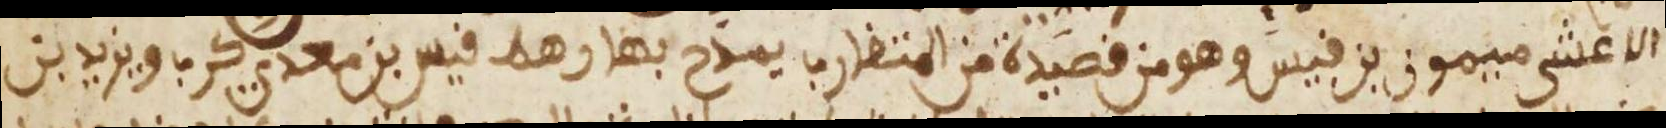الاعشى ميمون بن قيس و هو من قصيدة من المتقارب يمدح بها رهط قيس بن معدي كرب و يزيد بن
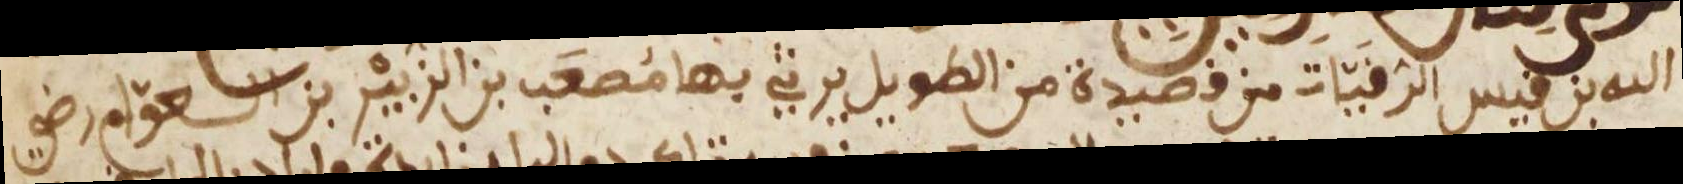الله بن قيس الرقيات من قصيدة من الطويل يرثي بها مصعب بن الزبير بن العوام رضي
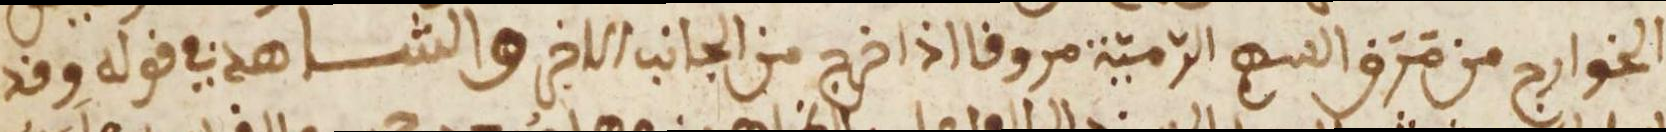الخوارج من مرق السهم الرمية مروقا اذا خرج من الجانب الاخر و الشاهد في قوله و قد
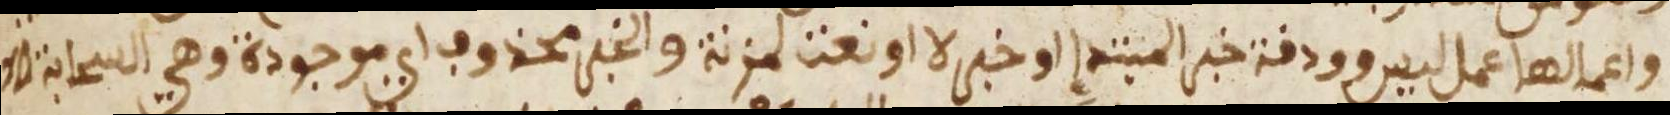و اعمالها عمل ليس و ودقة خبر المبتدإ او خبر لا او نعت لمزنة و الخبر محذوف اي موجودة و هي السحابة
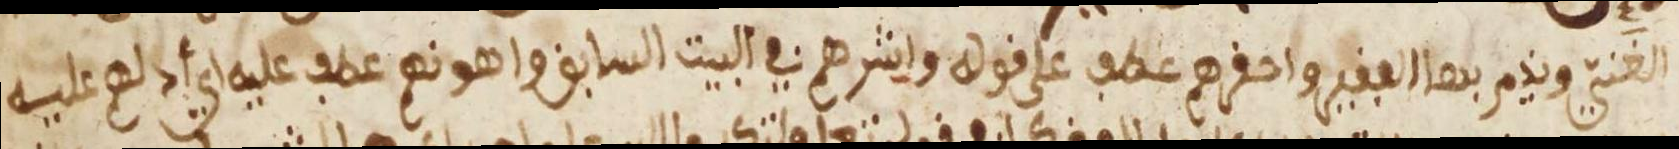الغني و يذم بها الفقير و احقرهم عطف على قوله واشرهم في البيت السابق و اهونهم عطف عليه اي أدلهم عليه
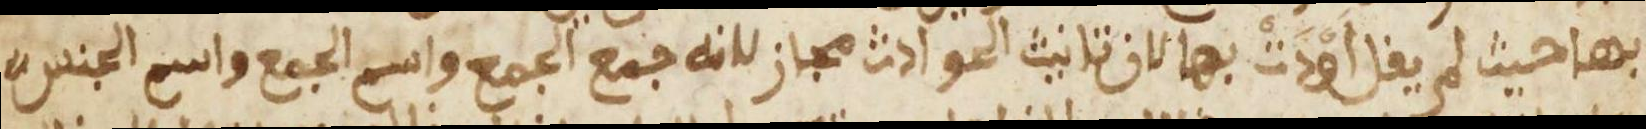بها حيث لم يقل اودت بها لان تانيث الحوادث مجاز لأنه جمع الجمع و اسم الجمع و اسم الجنس
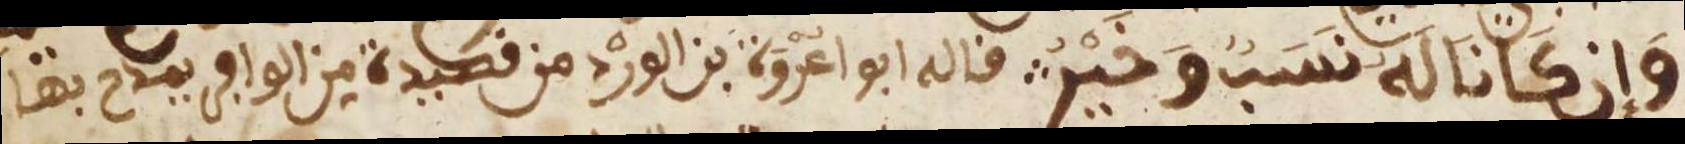و إن كانا له نسب و خير قاله ابوا عروة بن الورد من قصيدة من الوافر يمدح بها
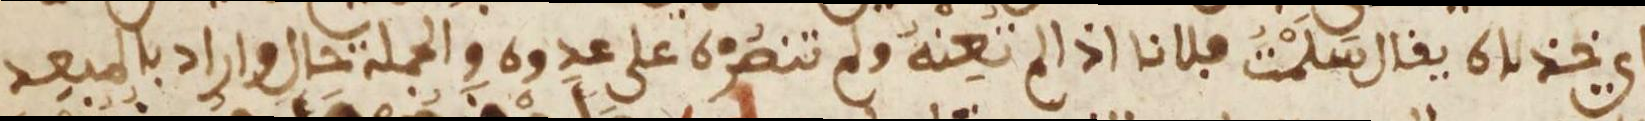اي خذلاه يقال سلمت فلانا اذا لم تعنه و لم تنصره على عدوه و الجملة حال و اراد بالمبعد
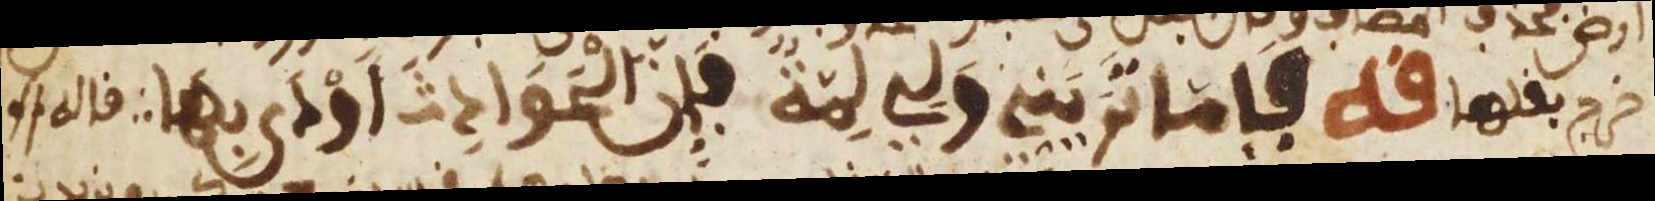خرج بقلها فه فإما تريني و لي لمة فإن الحوادث أودى بها قاله
